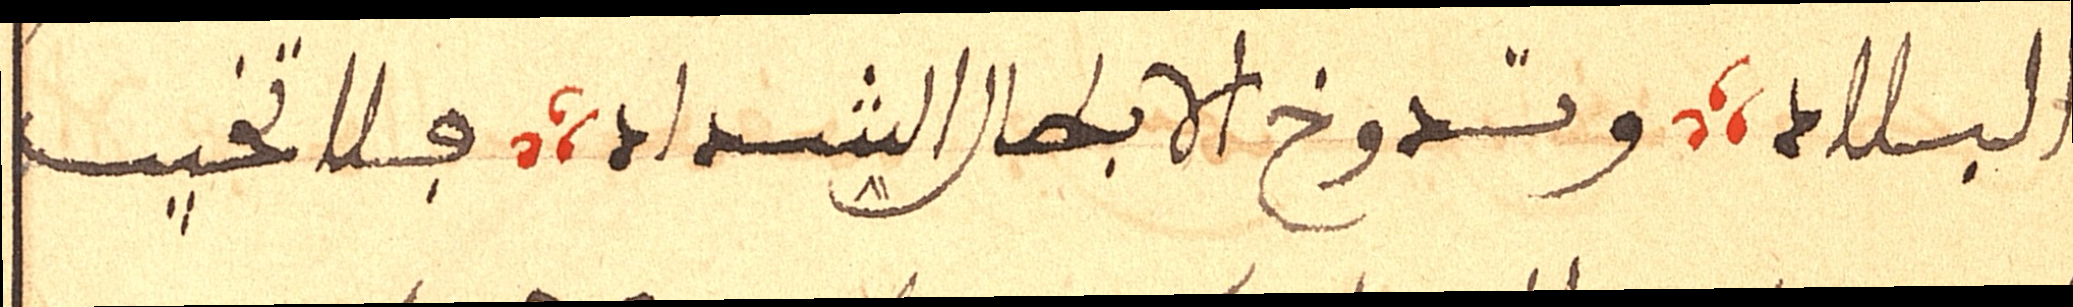الباد وتدوخ الابطال الشداد فلا تخيب
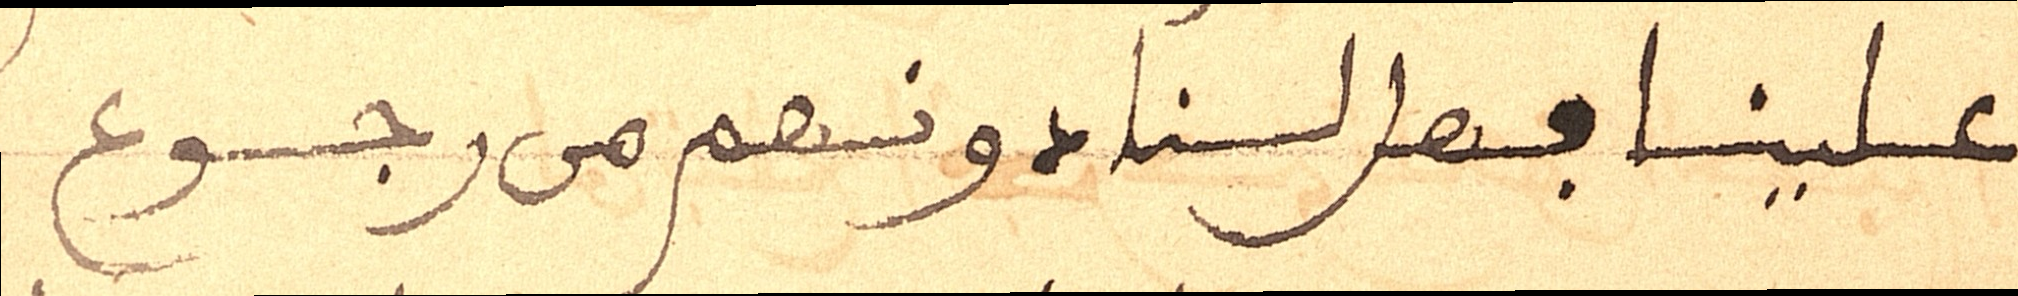علينا فهل لنا دونهم من جوع
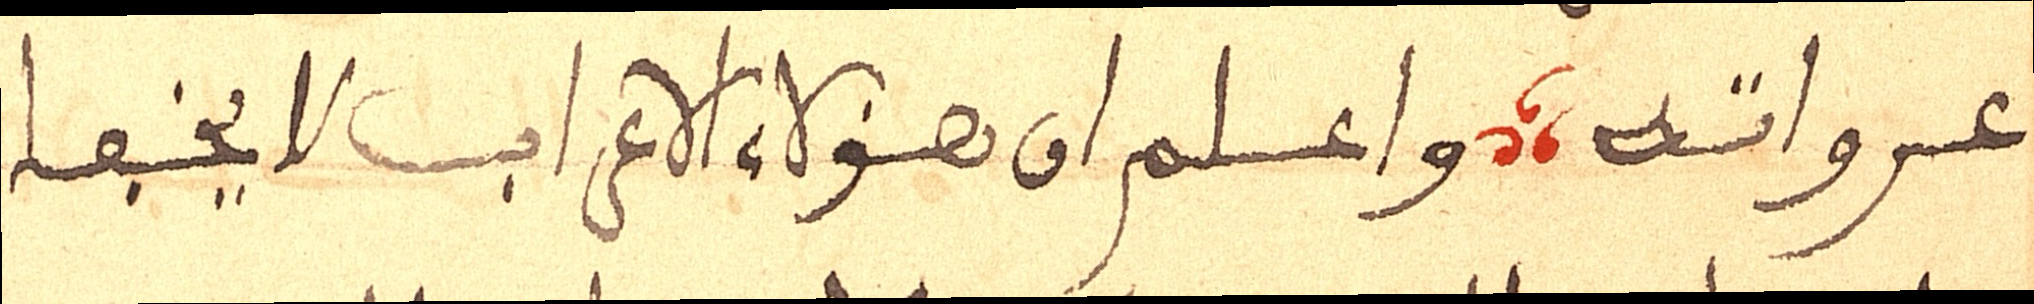عرواته واعلم ان هولاء الاعراب لا يخفا
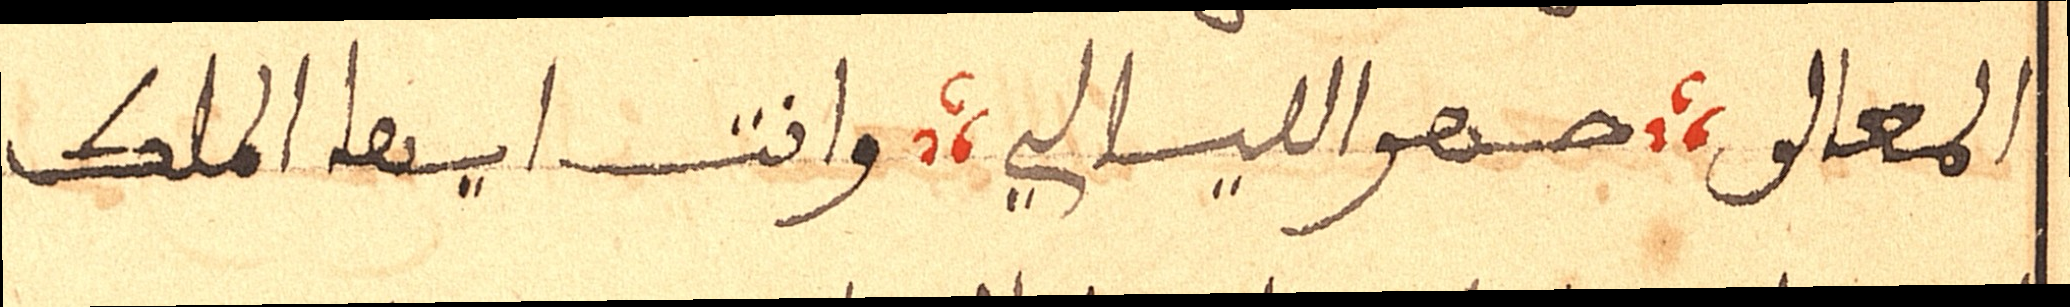المعالى صهر الليالي وانت ايها الملك
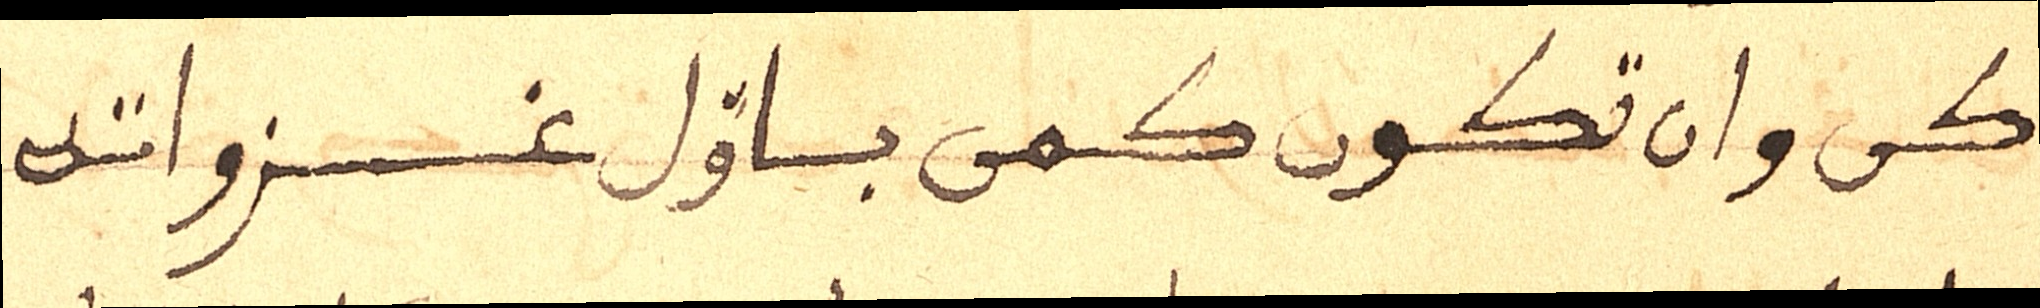كن وان تكون كمن باول غزو اته
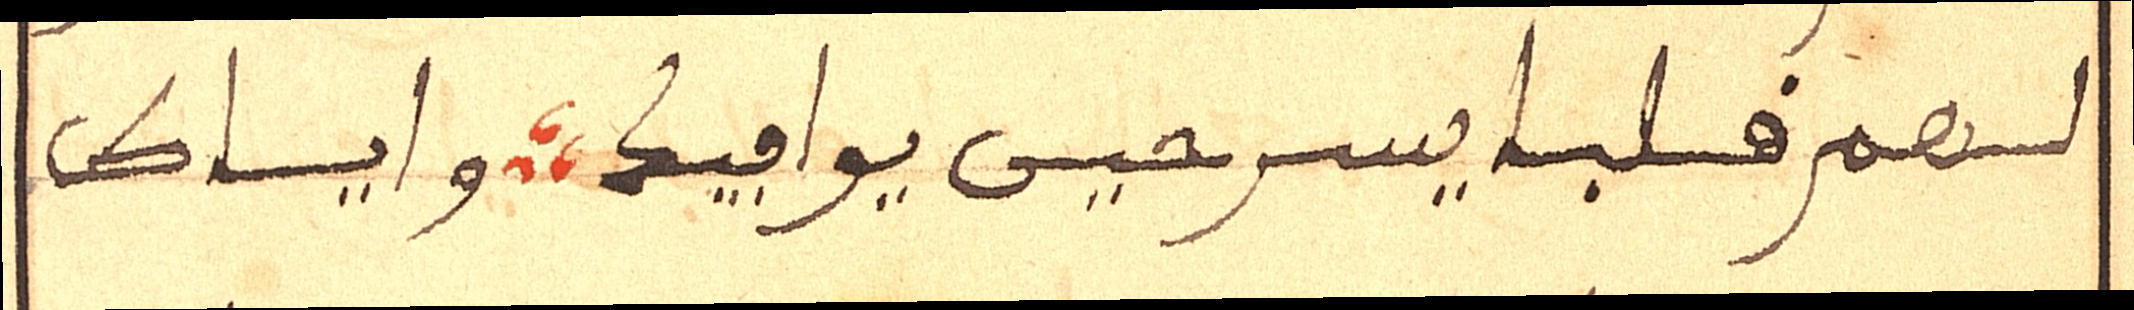لهم قلبا يس حين يوافيك واياك
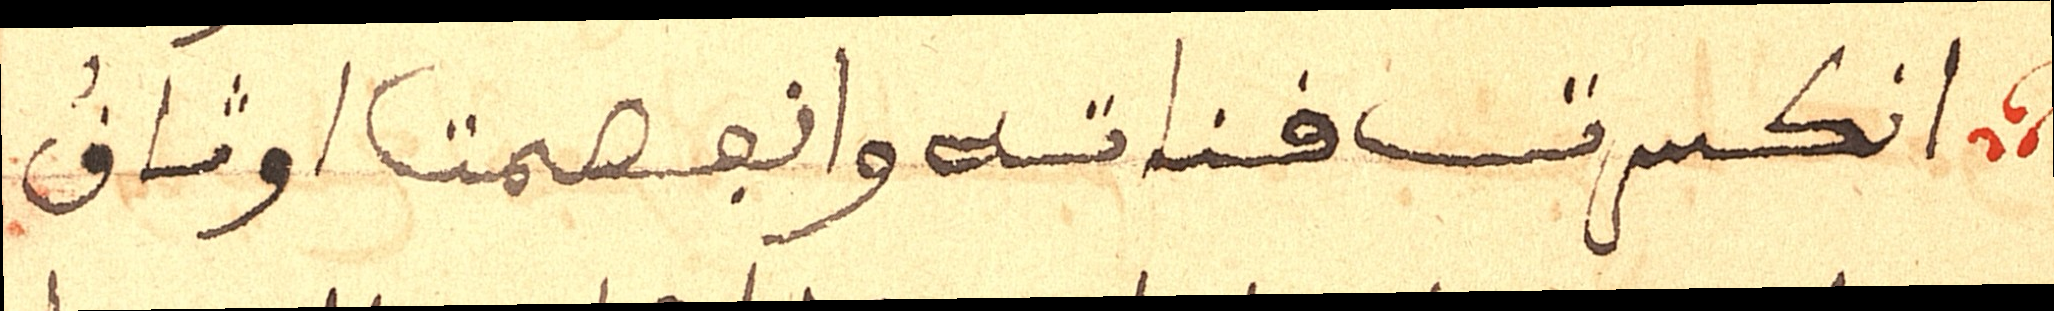انكسرت قناته وانفصمت اوثاق
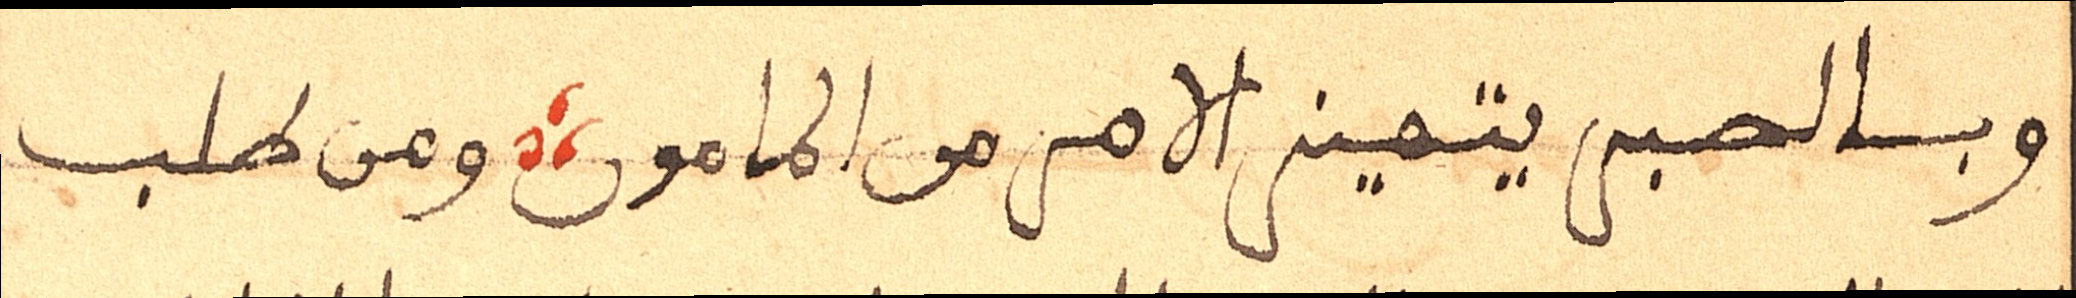بالصبر يتميز الامر من المامون ومن طلب
